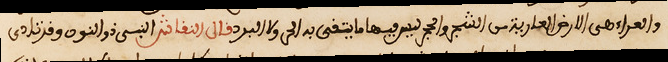والعراء هى الارض العارية من الشجر والحجر ليس فيها ما يتقى به الحر ولا البرد قال النقاش النبى ذو النون وقد تادى
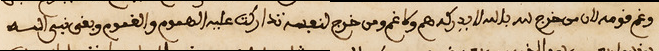وغم قومه لان من خرج لله بالله لا يدركه هم ولا غم ومن خرج لنفسه تداركت عليه الهموم الغموم وبقى نبى الله
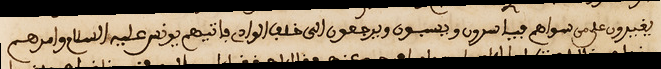يغيرون على من سواهم فياسرون ويسبون ويرجعون الى خلف الوادى فاتيهم يونس عليه السلام وامرهم
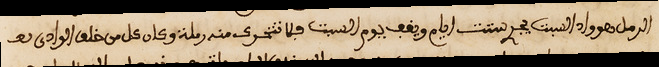الرمل هو واد السبت يجرى ستت ايام ويقف يوم السبت فلا تتحرك منه رملة وكان كل من خلف الوادى #
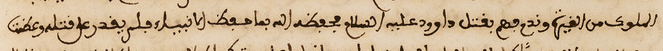الملوك من الغيرة وندم فهم بقتل داوود عليه السلام فحفظه الله بما حفظ الانبياء فلم يقدر على قتله وعظت
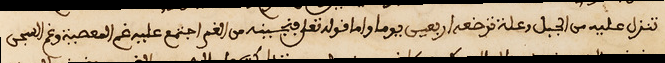تنزل عليه من الجبل وعلة ترضعه اربعين يوما واما قوله تعلى فنجينه من الغم اجتمع عليه غم المعصية وغم السجن
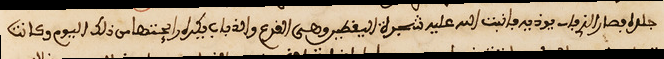جلده فصار الذي فان يوذيه فانبت الله عليه شجرة اليقطين وهى القرع والذباب يكره رائحتها من ذلك اليوم وكانت
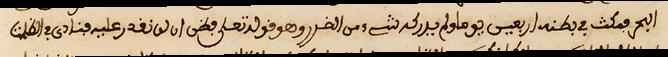البحر فمكث في بطنه اربعين يوما ولم يدركه شيء من الضرر وهو قوله تعلى فظن ان لن نقدر عليه فنادى في الظلمت
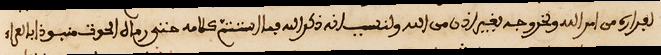لفراره من امر الله ولخروجه بغير اذن من الله ولنسيانه ذكر الله فما استتم كلامه حتى رماه الحوت منبوذا باالعراء
